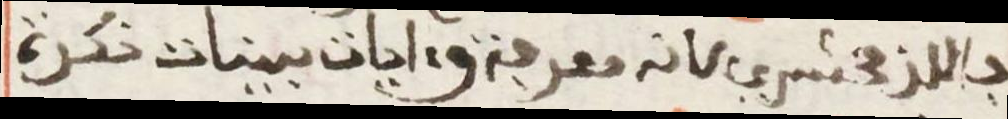فا للذمخشري لانه معرفة وءايات بينات نكرة
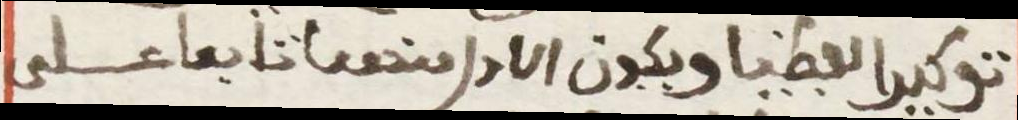توكيدا لفظيا ويكون الاول منهما تابعا على
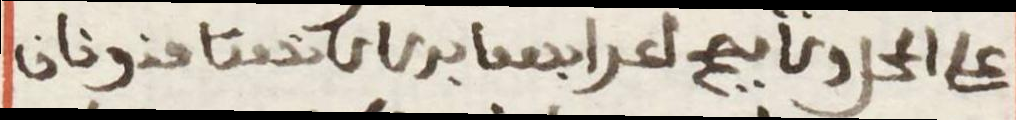على المحل ولا يصح اعرابهما بدلا لانهما منونان
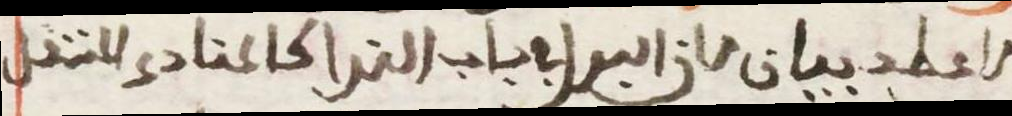لا عطف بيان لان البدل في باب الندا كالمنادى المستقل
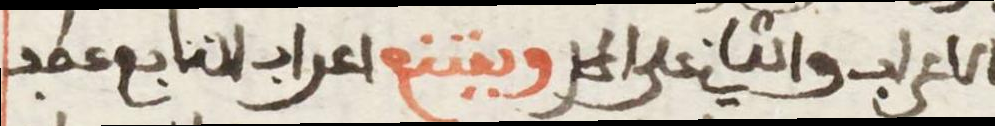الاعراب والثاني على المحل ويمتنع اعراب التابع عطف
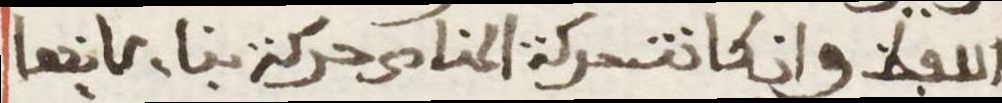اللفظ وان كانت حركة المنادى حركة بناء لانها
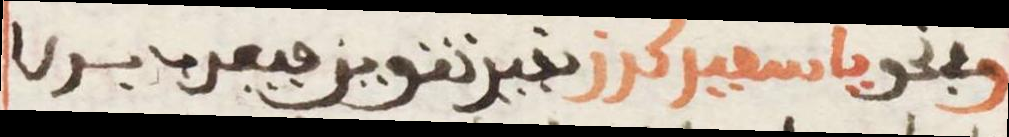وفي نحو يا سعيد كرز نفيد تنوين فيعرب بدلا
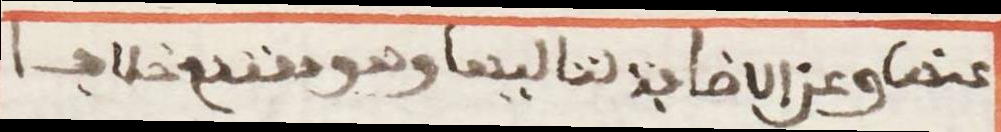عنها وعن الاضافة لتاليها وهو مقتنع خلاف ا
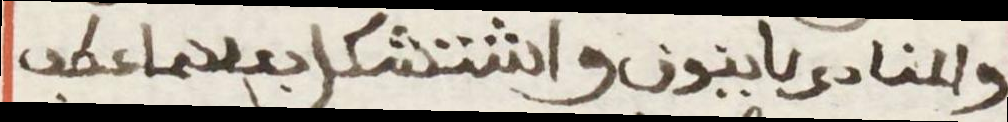والمنادى لا ينون واشتشكل فعلهما عطف
